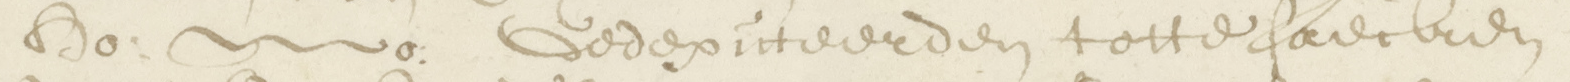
Ho:Mo: Gedeputeerden totte saecken
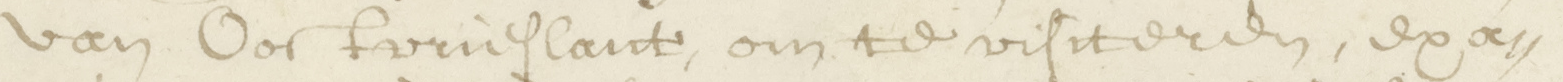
van Oostvrieslandt, om te visiteren, exa„
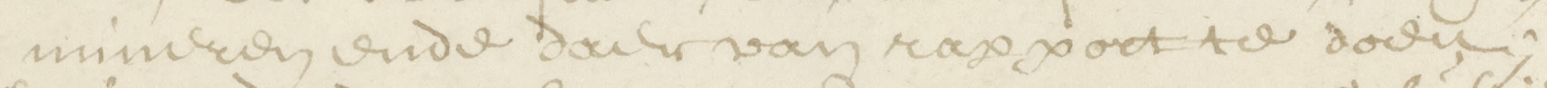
mineren ende daer van rapport te doen.
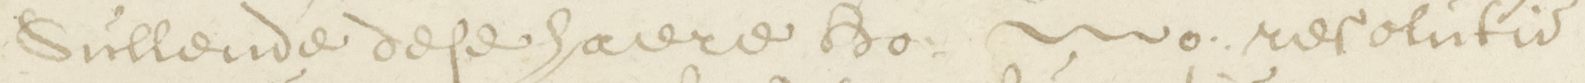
Sullen dese haere Ho:Mo: resolutie
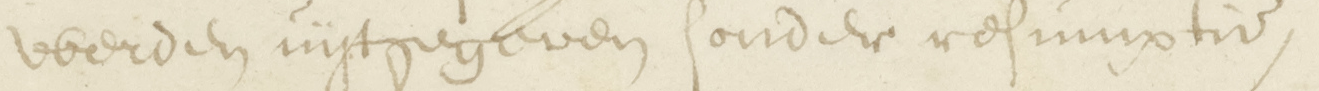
worden uijtgegeven sonder resumptie.
